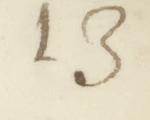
13
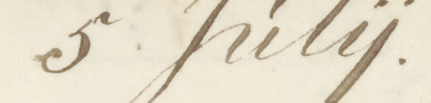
5 Julij.
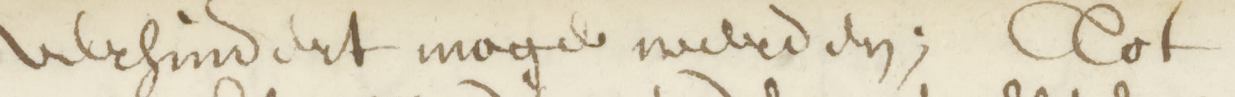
verhindert moge werden; Tot
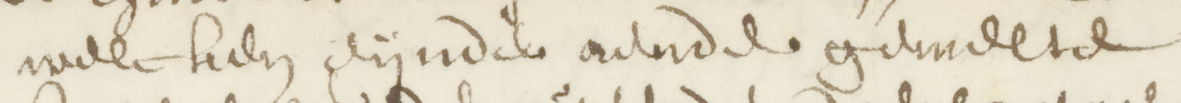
welcken eijnde aende gemelte
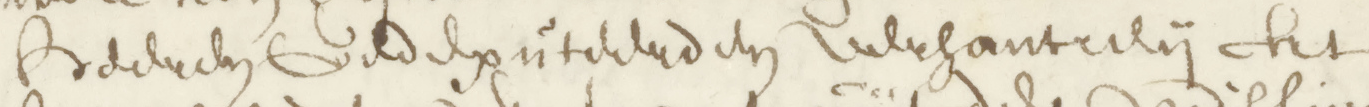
Heeren Gedeputeerden verhantreijckt
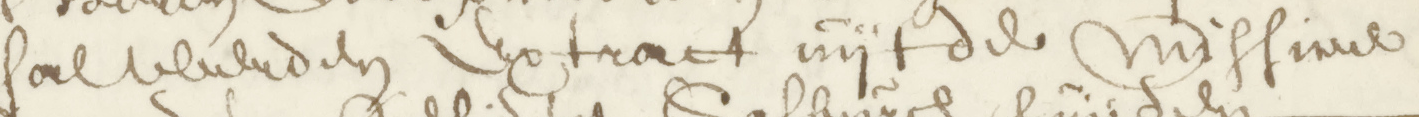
sal werden Extract uijt de Missive
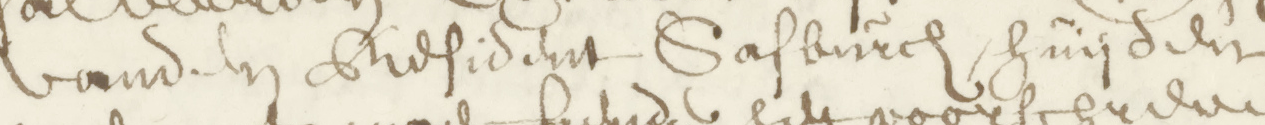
vanden Resident Sasburch, huijden
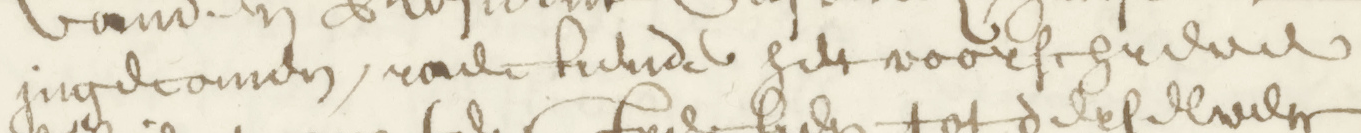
ingecomen, raeckende het voorschreve
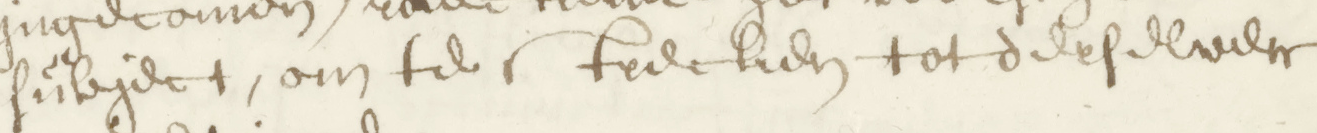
subject, om te strecken tot derselver
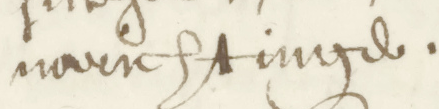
narichtinge.
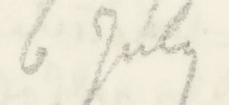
6. July
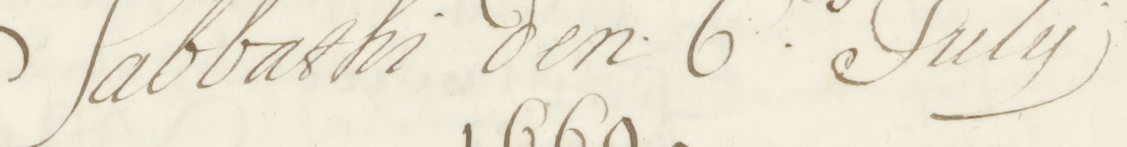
Sabbathi den. 6en. Julij
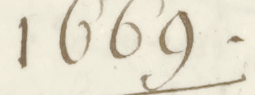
1669.
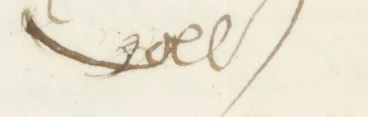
Coll
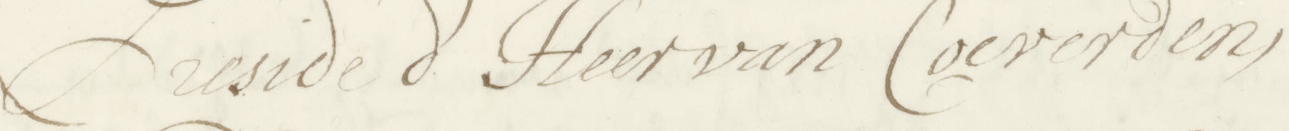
Preside d'Heer van Coeverden,
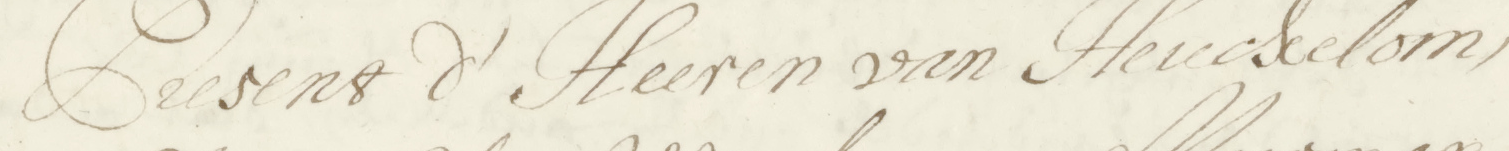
Present d'Heeren van Heuckelom,
